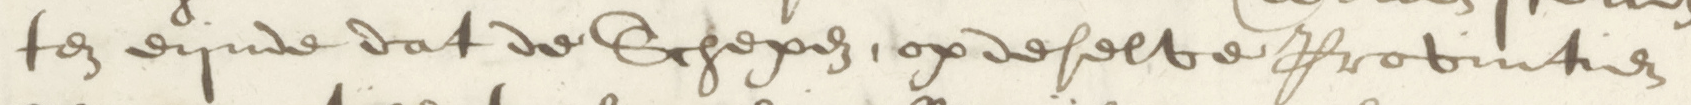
ten eijnde dat de Schepen, op deselve Provintien
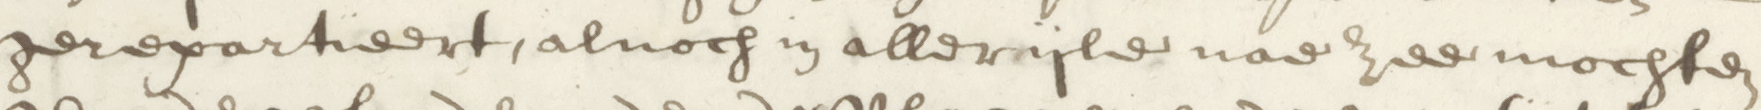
gerepartieert, alnoch in allerijle nae zee mochten
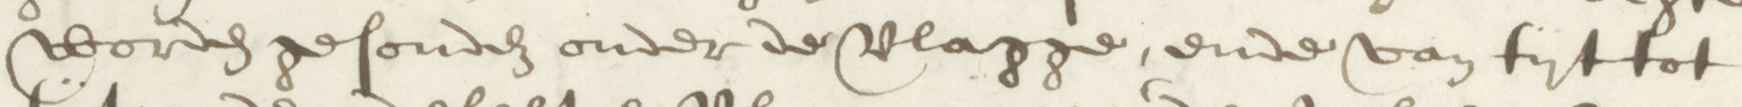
worden gesonden onder de vlagge, ende van tijt tot
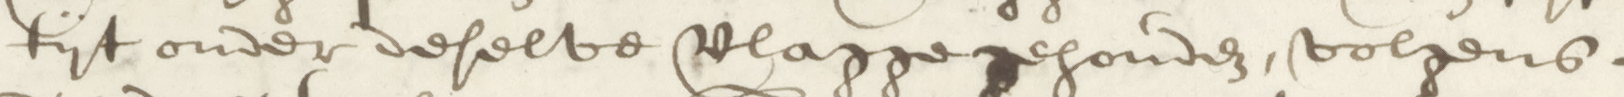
tijt onder deselve vlagge gehouden, volgens
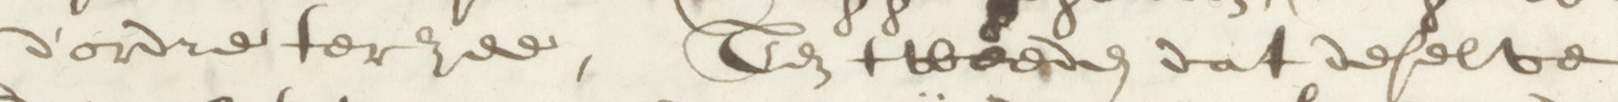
d'ordre ter zee. Ten tweeden dat deselve
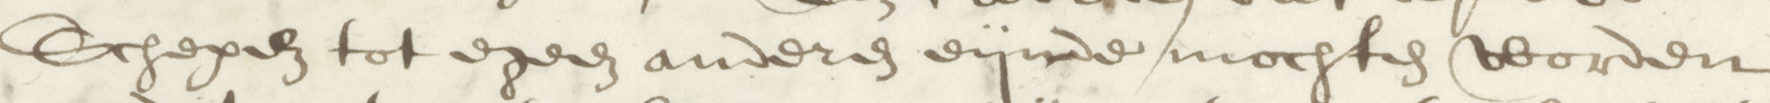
Schepen tot egeen anderen eijnde mochten worden
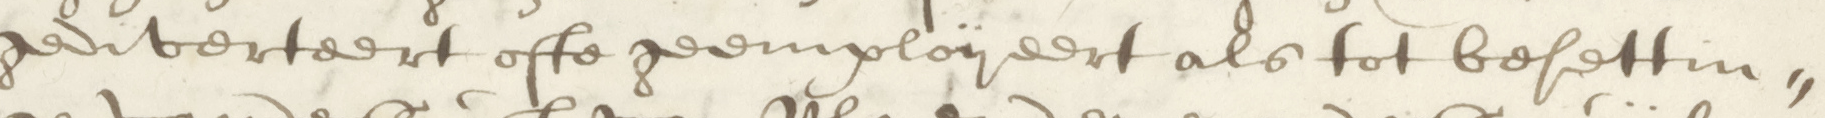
gediverteert ofte geemploijeert als tot besettin„
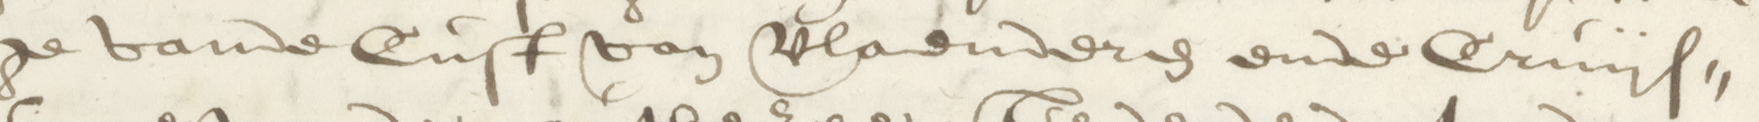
ge vande Cust van Vlaenderen ende Cruijs„
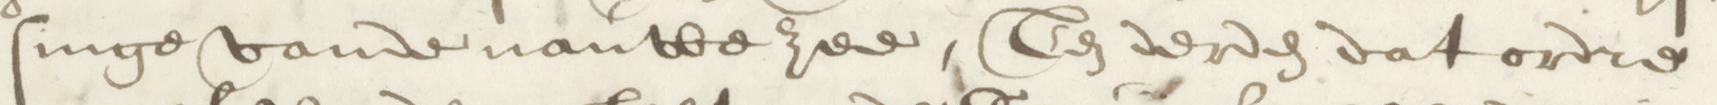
singe vande nauwe zee. Ten derden dat ordre
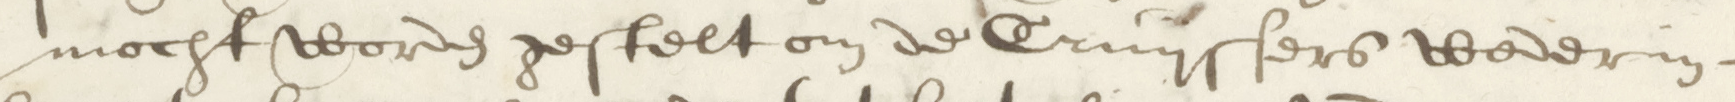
mocht worden gestelt om de Cruijssers weder in
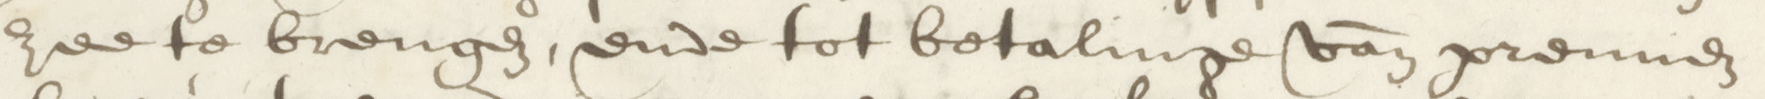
zee te brengen, ende tot betalinge van premien
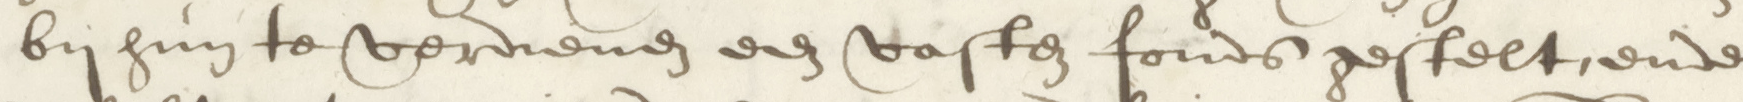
bij hun te verdienen een vasten fonds gestelt, ende
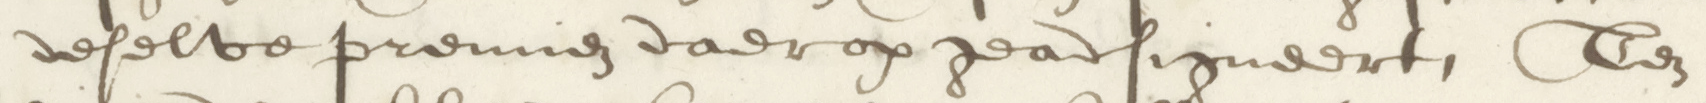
deselve premien daer op geadsigneert. Ten
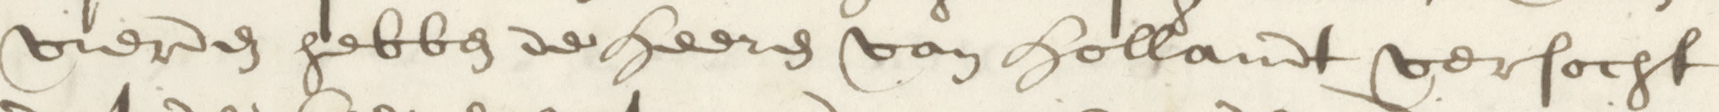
vierden hebben de heeren van Hollandt versocht
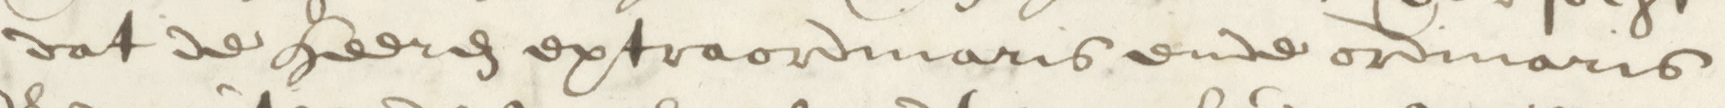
dat de heeren extraordinaris ende ordinaris
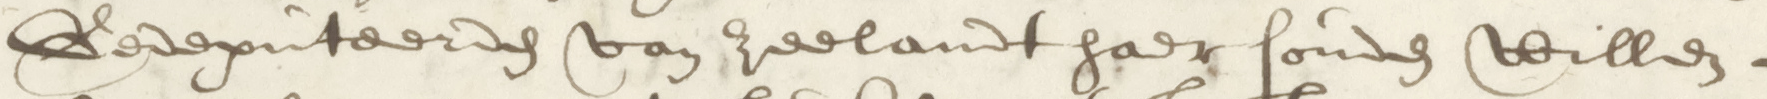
Gedeputeerden van Zeelandt haer souden willen
